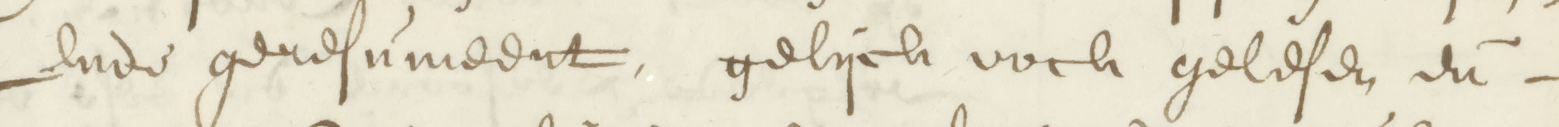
ende geresumeert, gelijck oock gelesen en
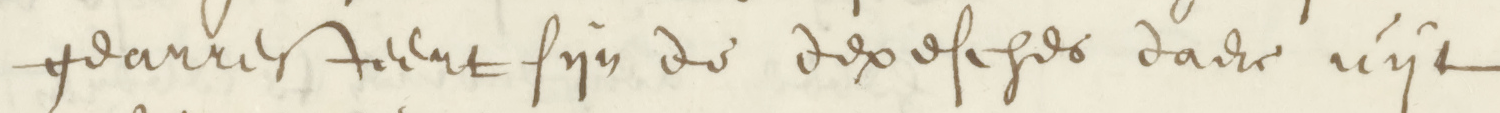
gearresteert sijn de depesches daer uijt
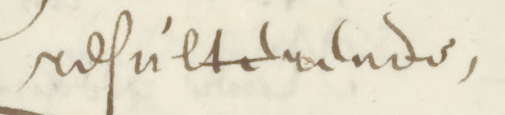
resulterende.
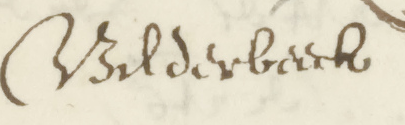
Bilderbeeck
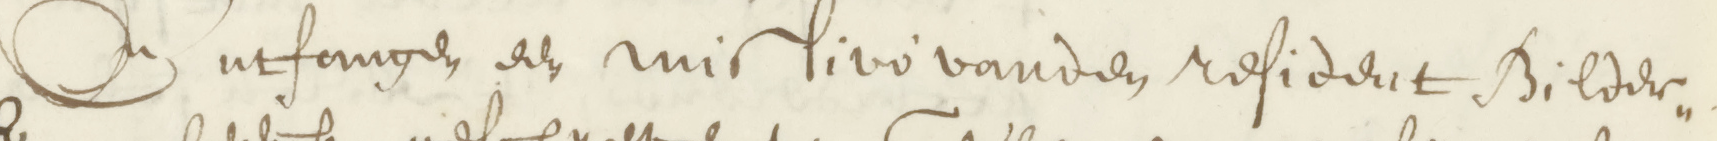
Ontfangen een missive vanden resident Bilder,,
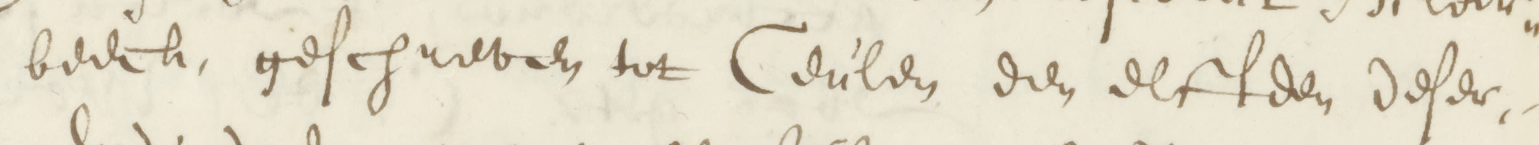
beeck, geschreven tot Ceulen den elffden deser
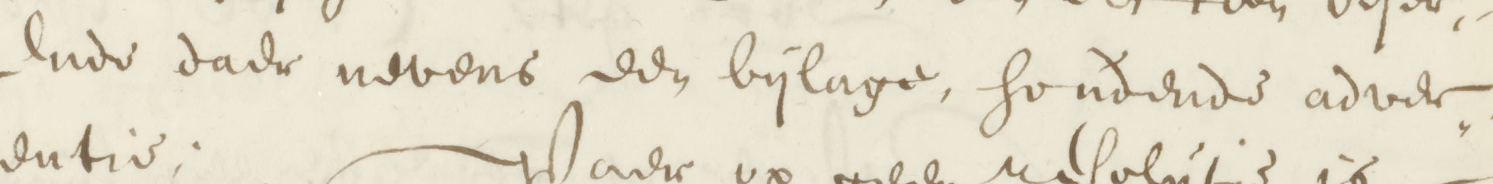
ende daer nevens een bijlage, houdende adver,,
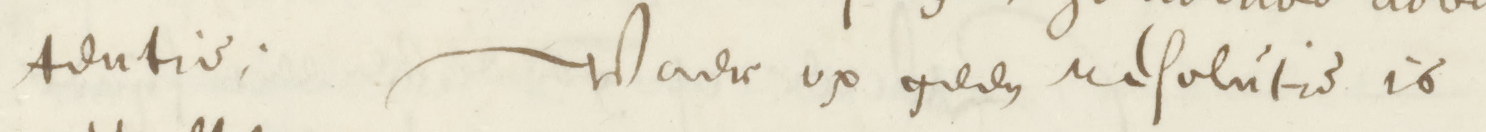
tentie: Waer op geen resolutie is
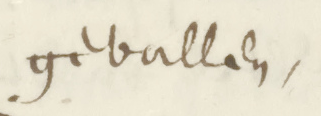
gevallen.
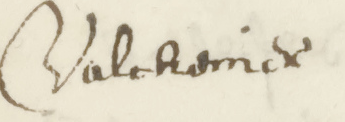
Valckenier
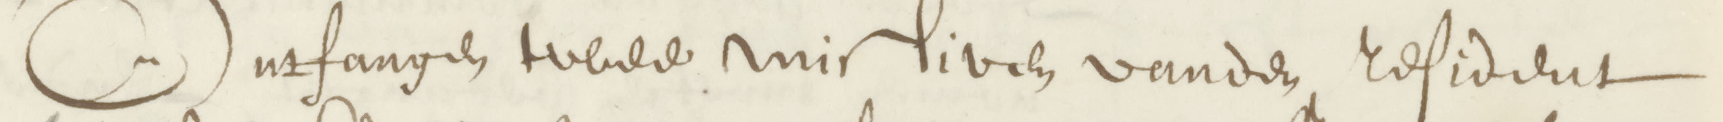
Ontfangen twee missiven vanden resident
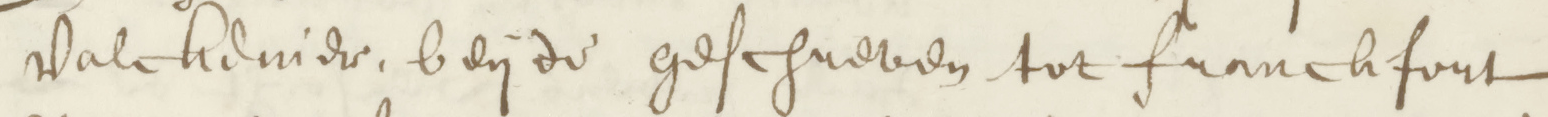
Valckenier, beijde geschreven tot Franckfort
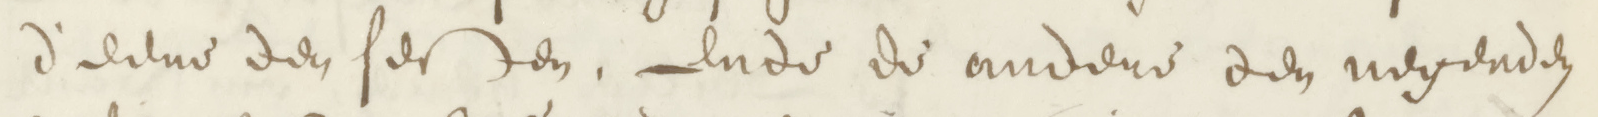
d‛eene den sesten, ende de andere den negenden
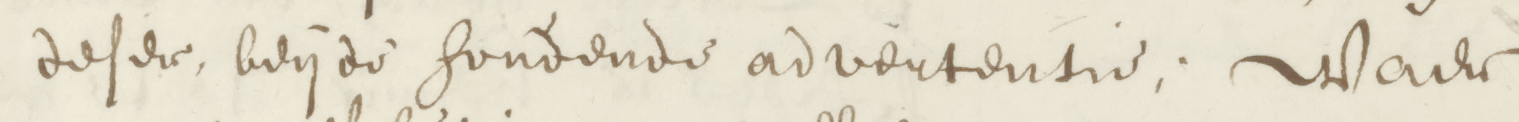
deser, beijde houdende advertentie; Waer
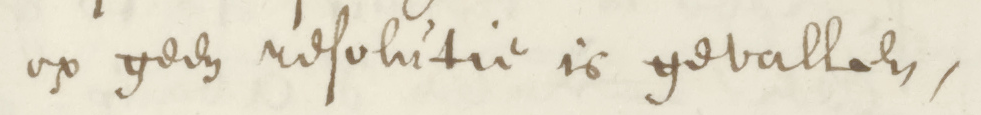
op geen resolutie is gevallen.
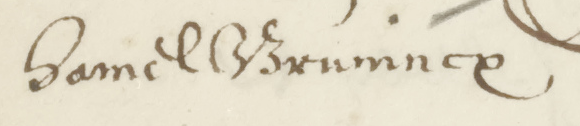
Hamel Brunincx,
